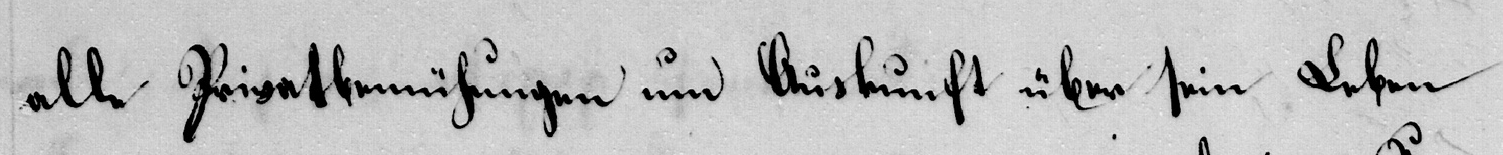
alle Privatbemühungen um Auskunft über sein Leben
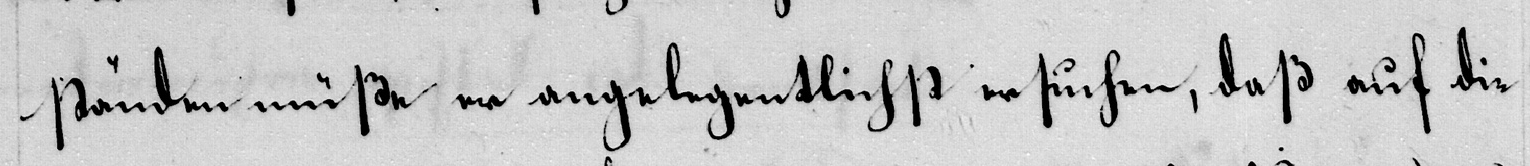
ständen müße er angelegentlichst ersuchen, daß auf di¬
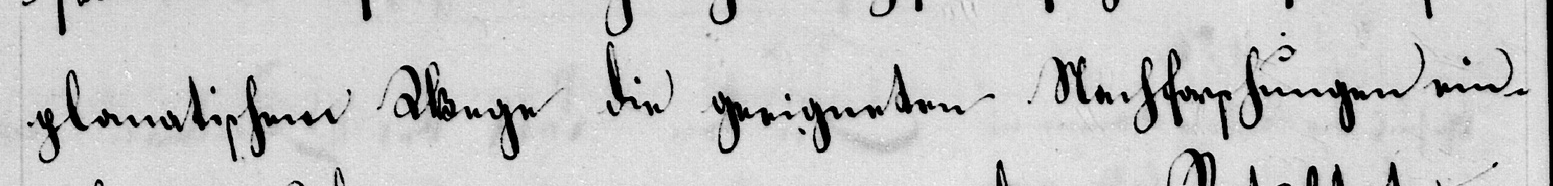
plomatischem Wege die geeigneten Nachforschungen ein¬
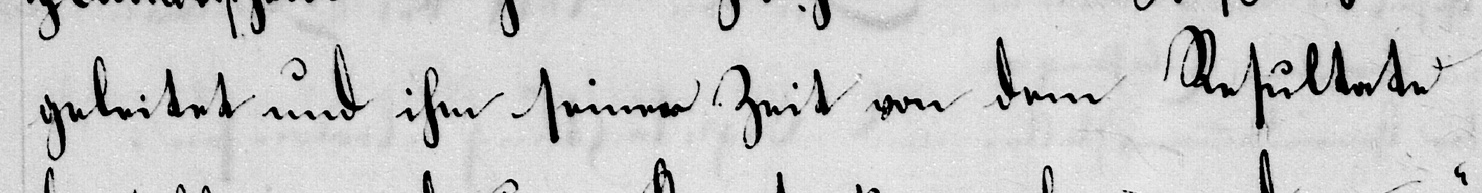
geleitet und ihm seiner Zeit von dem Resultate
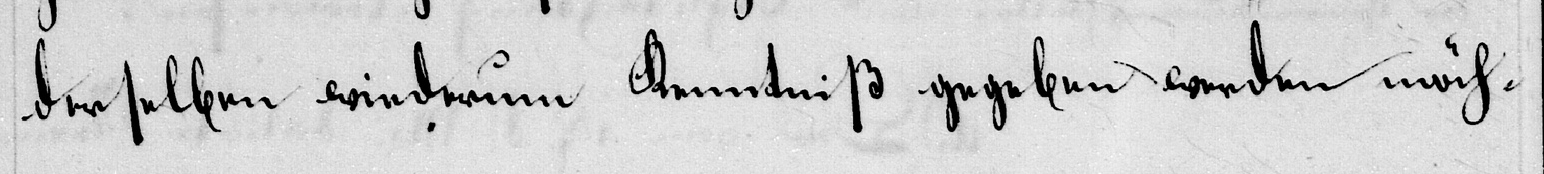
derselben wiederum Kenntniß gegeben werden möch¬
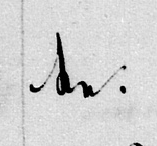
te.
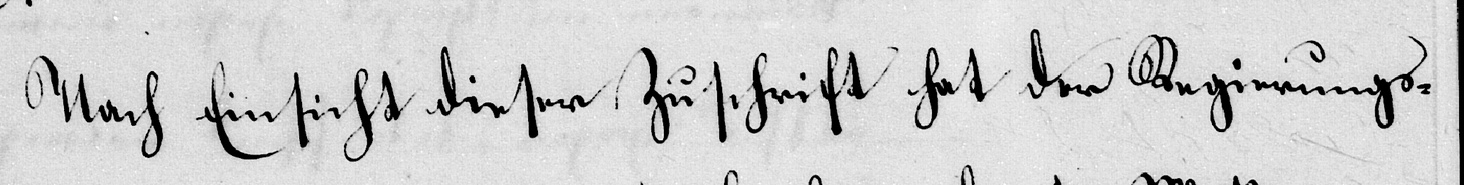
Nach Einsicht dieser Zuschrift hat der Regierungs¬
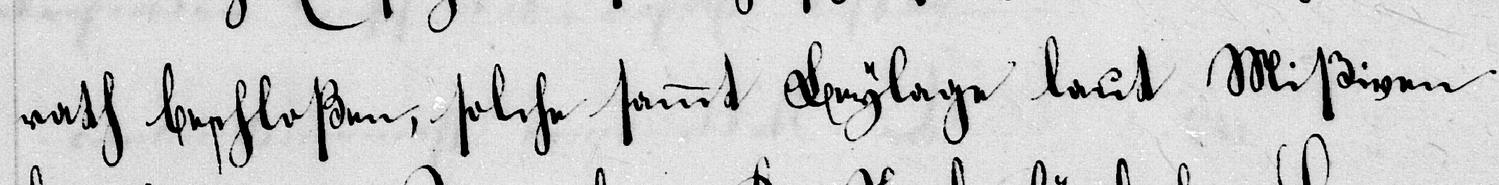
rath beschloßen, solche sammt Beylage laut Mißiven
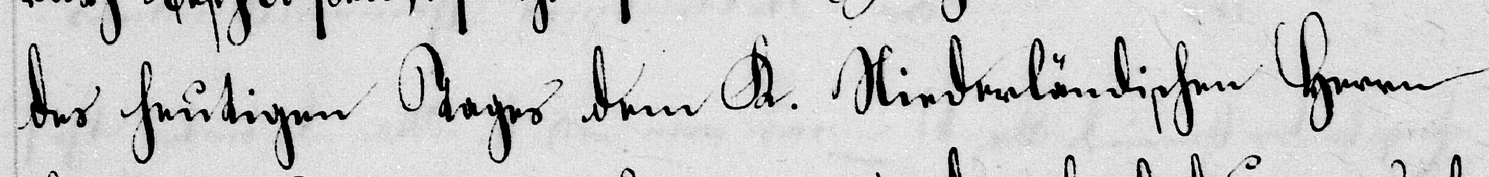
des heutigen Tages dem K. Niederländischen Herrn
